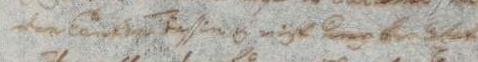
den Canton Tessin & nicht uns berührt.
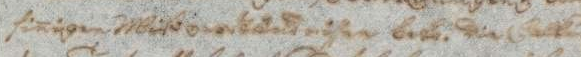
sinnigen Mißverständnissen betr. die Haltung
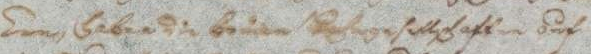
ken, haben die beiden Bahngesellschaften auf
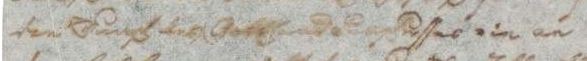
den Wunsch des Gotthardausschusses ein an
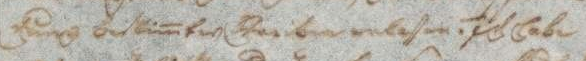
chung bestimmtes Schreiben erlassen. Ich habe
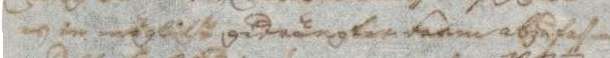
es in möglichst gedrängter Form abzufassen
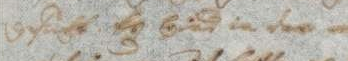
gesucht. Es wird in der
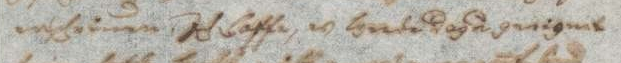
erscheinen. Ich hoffe, es werde dazu geeignet
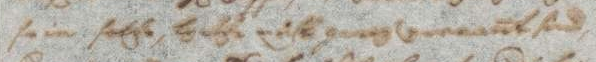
sein, solche, welche nicht ganz verrannt sind,
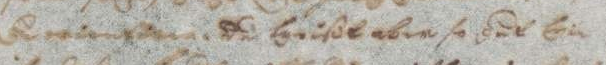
zu orientiren. Du weißt aber so gut wie
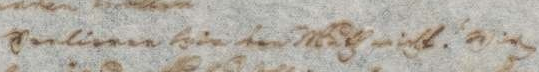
Verlieren wir den Muth nicht. Wir
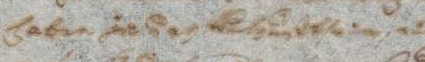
haben ja das Bewußtsein,
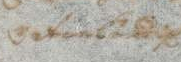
vaterländischen
